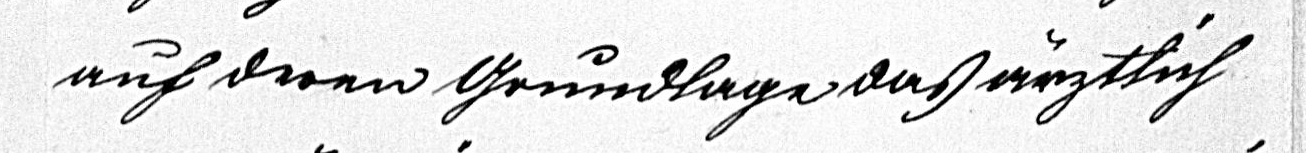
auf deren Grundlage das ärztlich
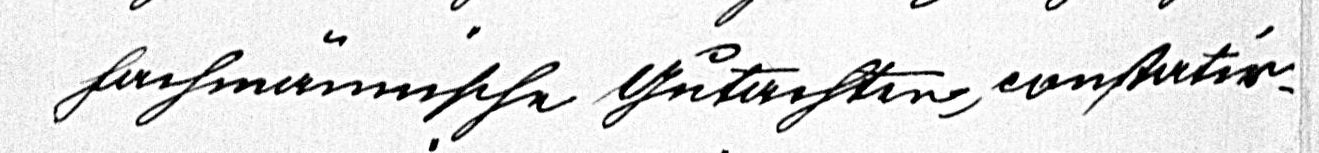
fachmännische Gutachten, constatir¬
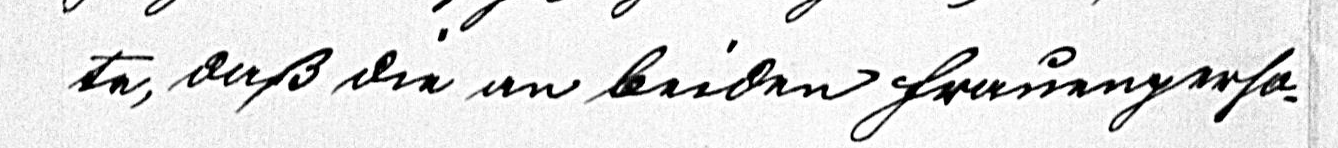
te, daß die an beiden Frauenperso
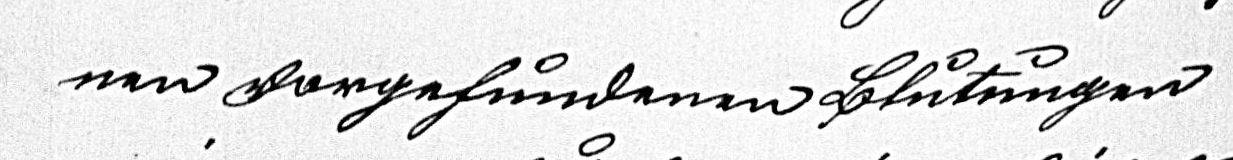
nen vorgefundenen Blutungen
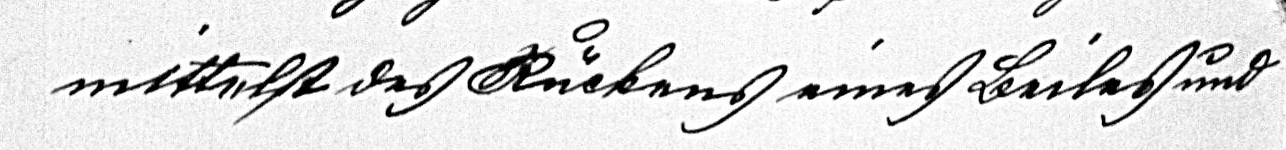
mittelst des Rückens eines Beiles und
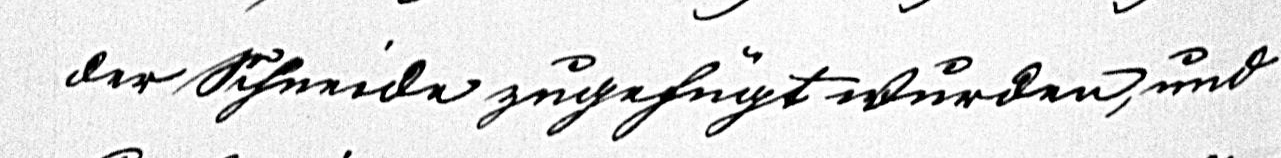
der Schneide zugefügt wurden, und
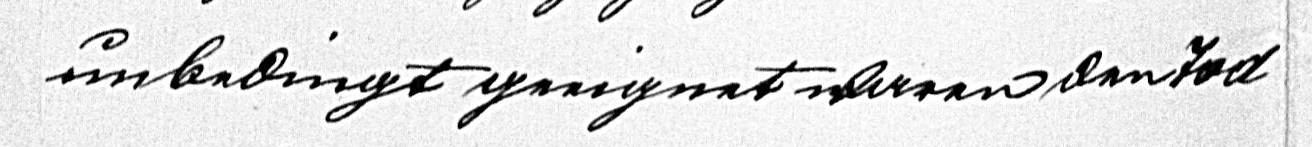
unbedingt geeignet waren den Tod
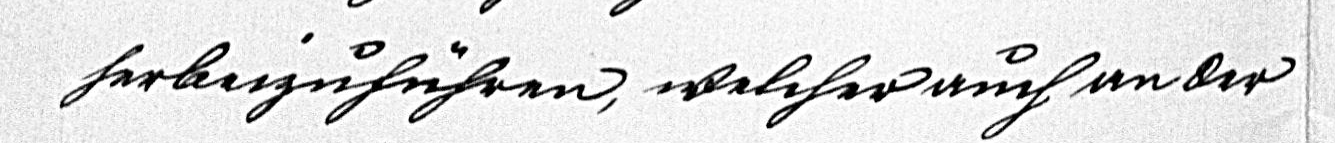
herbeizuführen, welcher auch an der
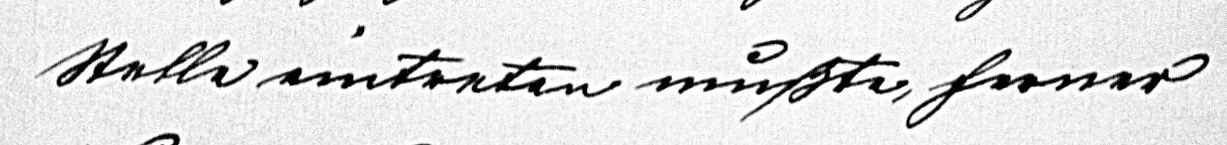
Stelle eintreten mußte, ferner
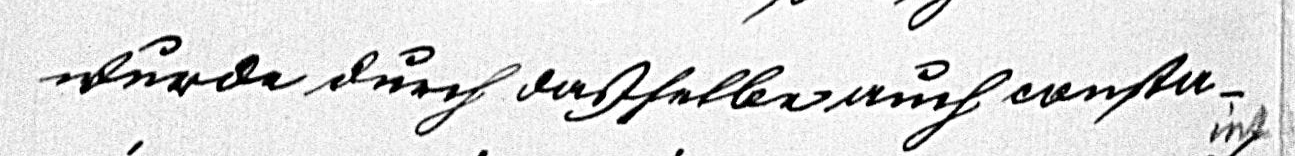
wurde durch dasselbe auch consta¬
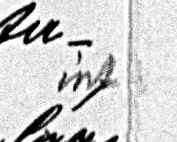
int
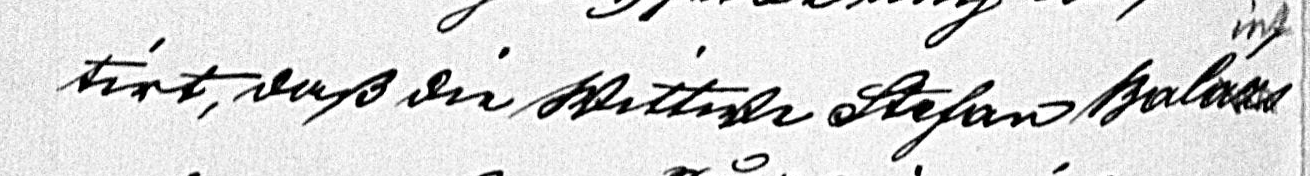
tirt, daß die Wittwe Stefan Bal
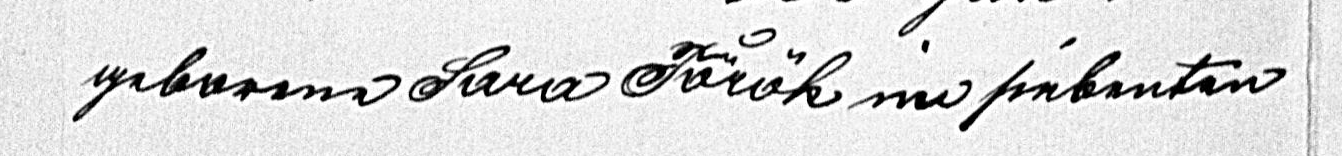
geborene Sara Török im siebenten
